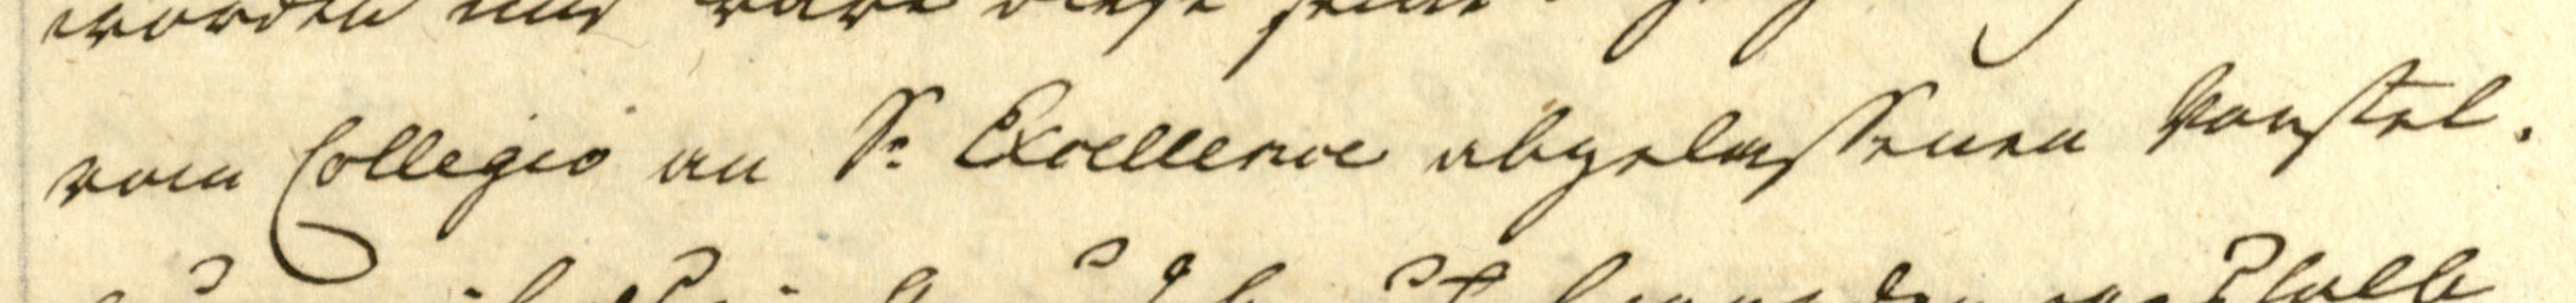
vom Collegio an Sr. Excellence abgelassenen Vorstel¬
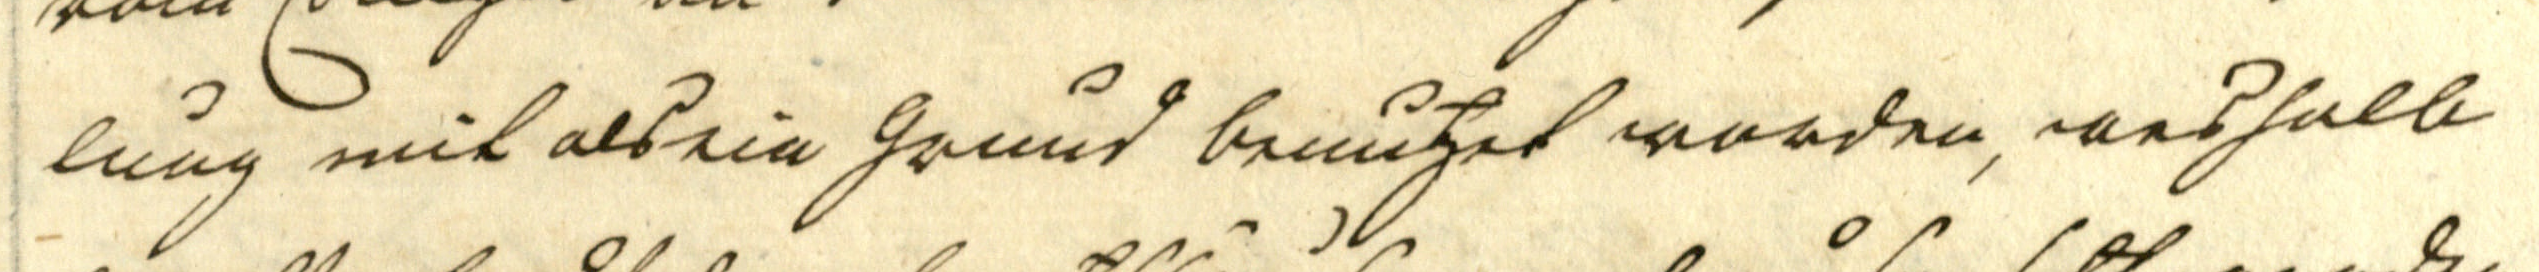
lung mit als ein Grund benutzet worden, weshalb
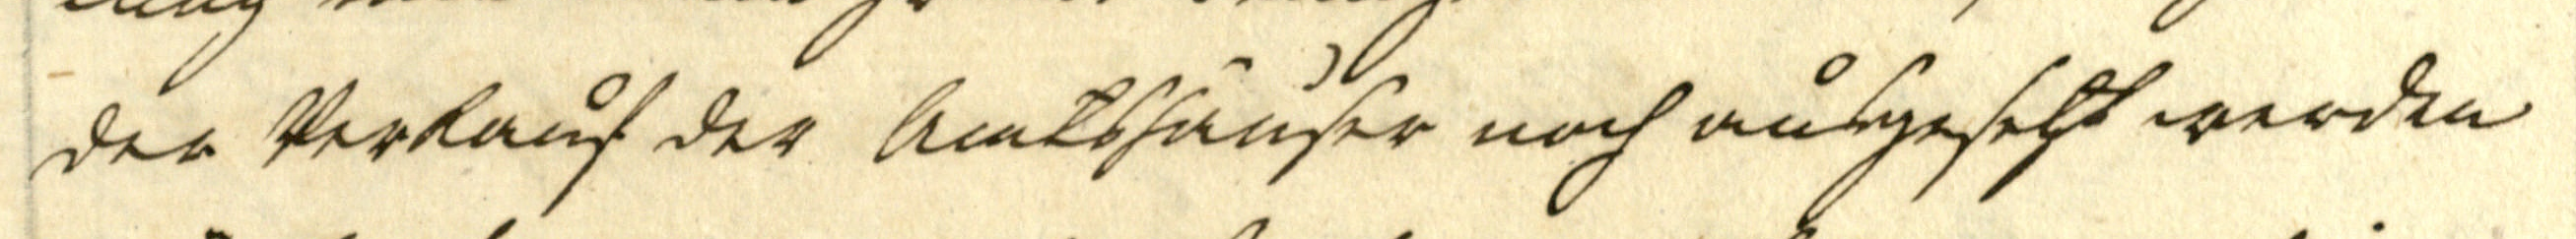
den Verkauf der Amtshäuser noch ausgesetzt werden
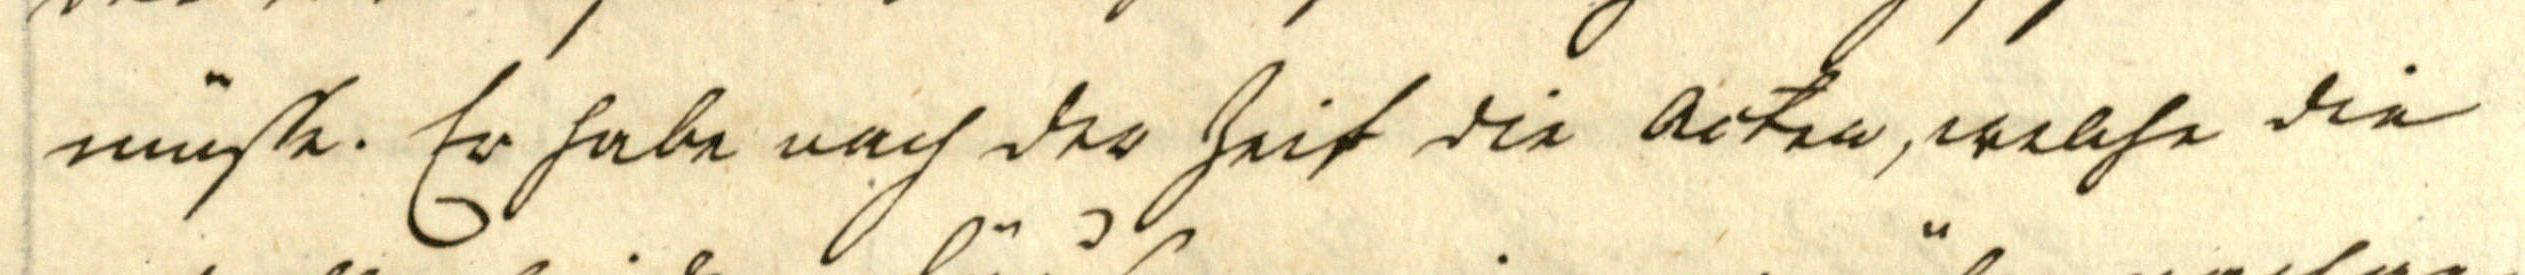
müsse. Er habe nach der Zeit die Acten, welche die
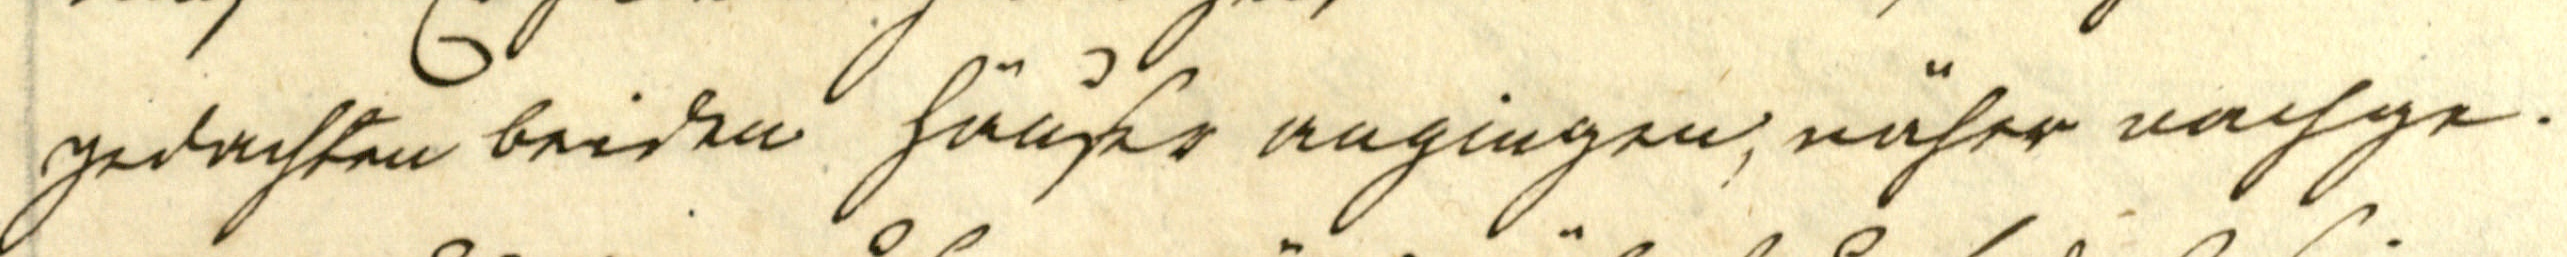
gedachten beiden Häuser angingen, näher nachge¬
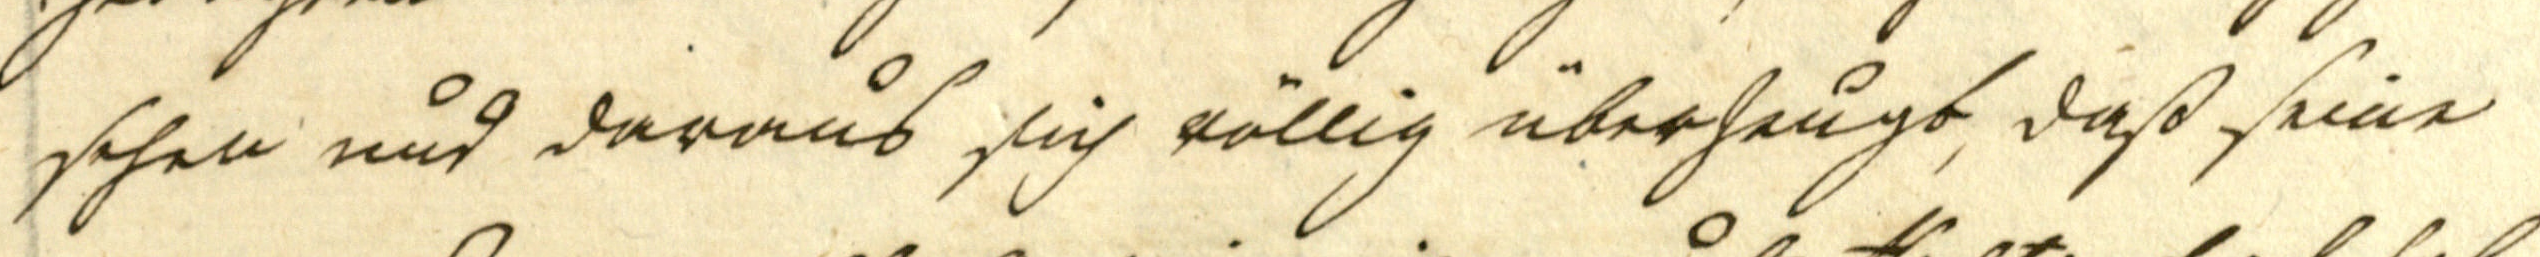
sehen und daraus sich völlig überzeugt, daß seine
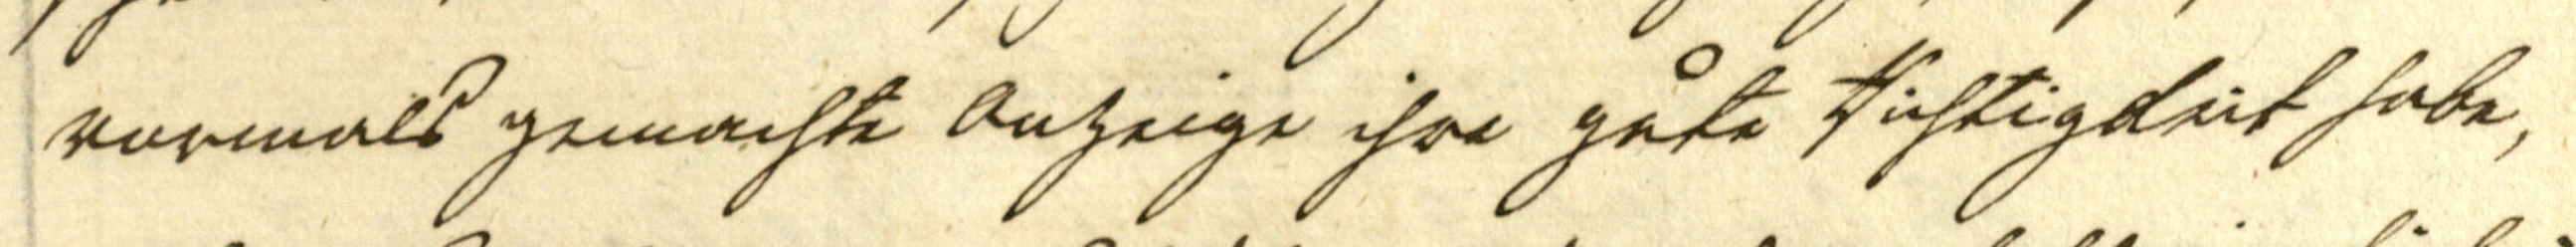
vormals gemachte Anzeige ihre gute Richtigkeit habe,
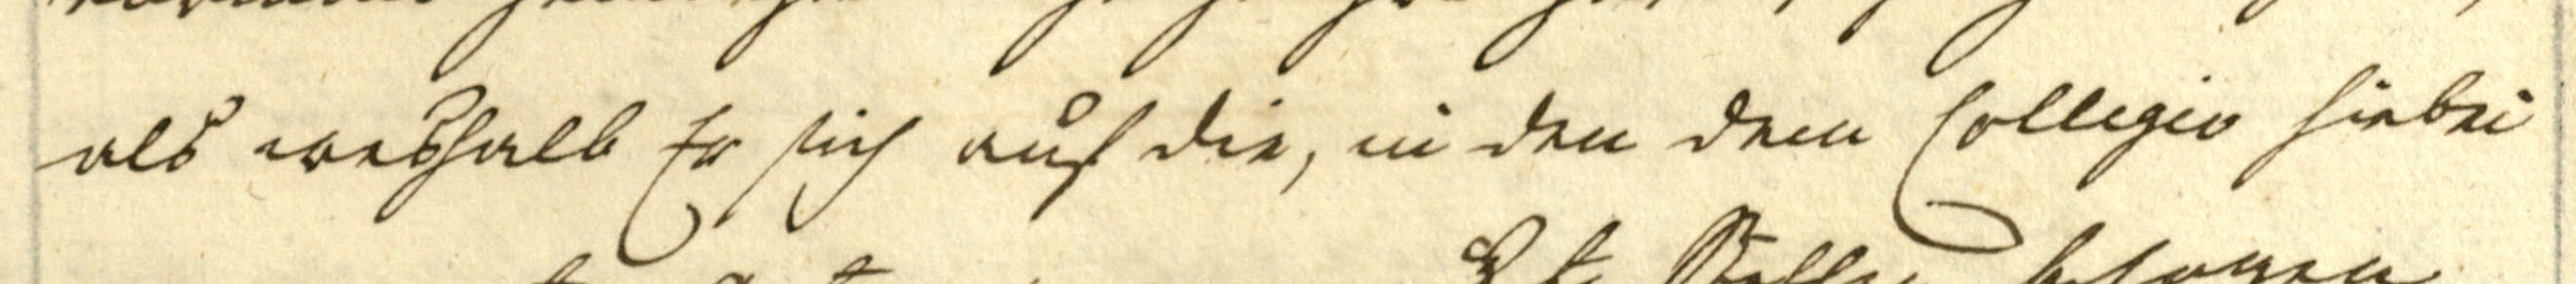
als weshalb Er sich auf die, in den dem Collegio hiebei
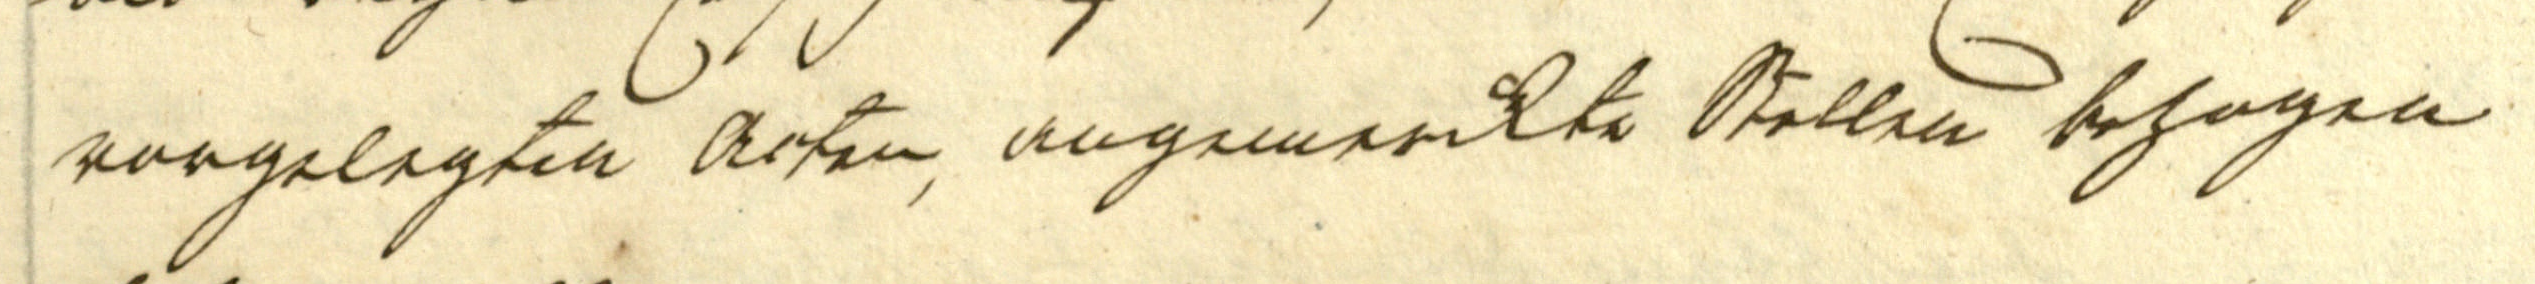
vorgelegten Acten angemerckte Stellen bezogen
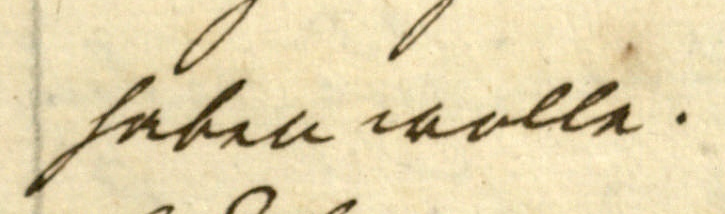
haben wolle.
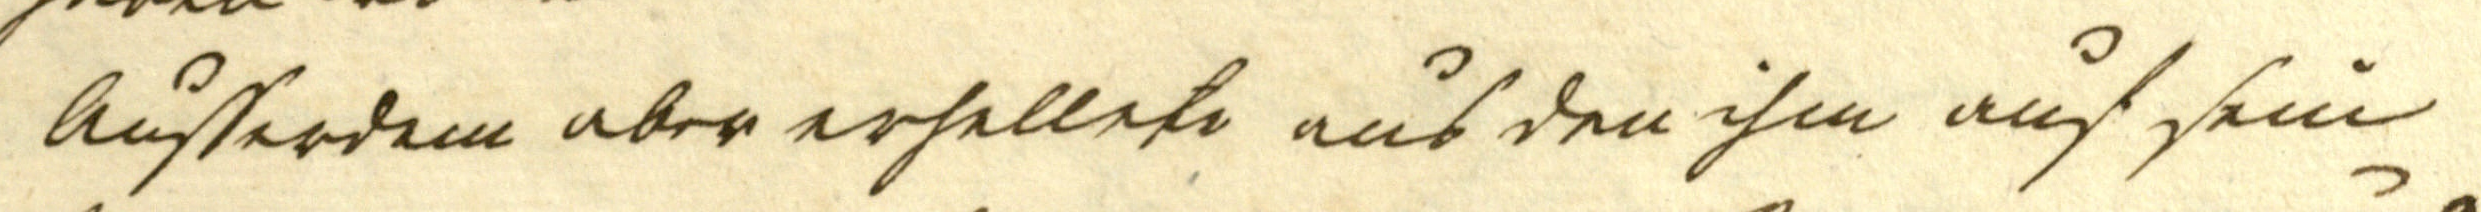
Ausserdem aber erhellete aus den ihm auf sein
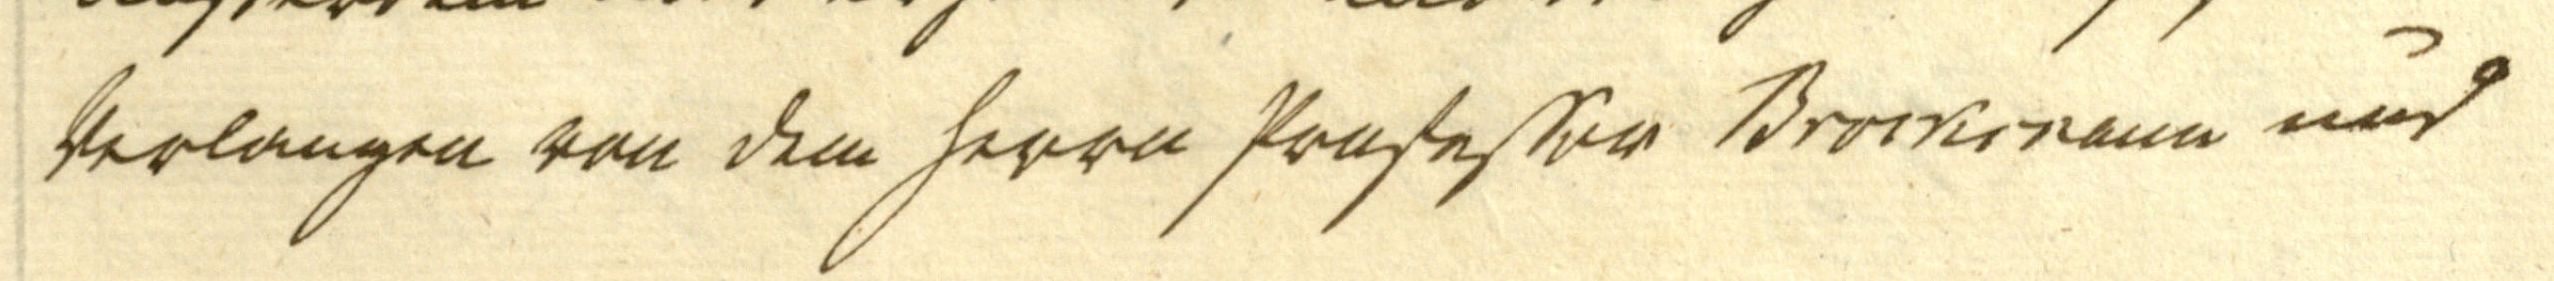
Verlangen von dem Herrn Professor Brockmann und
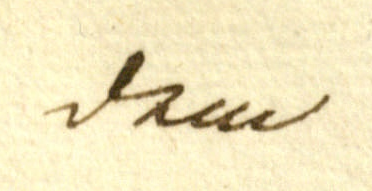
dem
